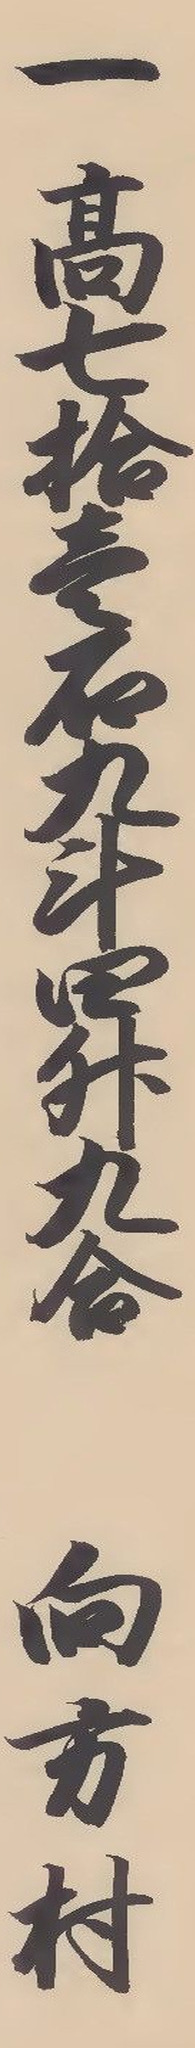一高七拾壱石九斗四升九合向方村
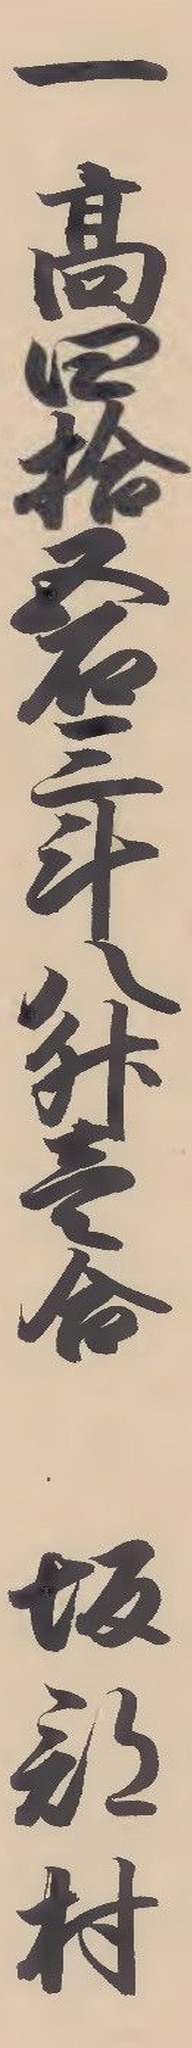一高四拾五石三斗八升壱合坂部村
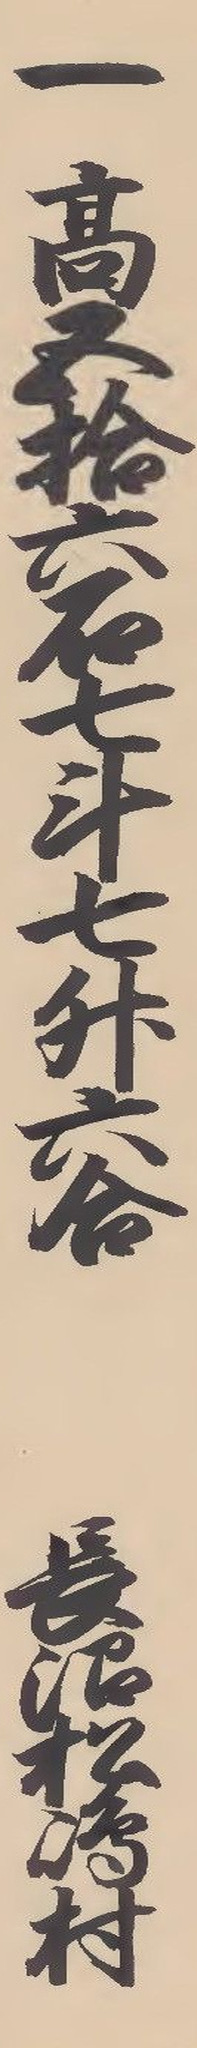一高五拾六石七斗七升六合長沼松島村
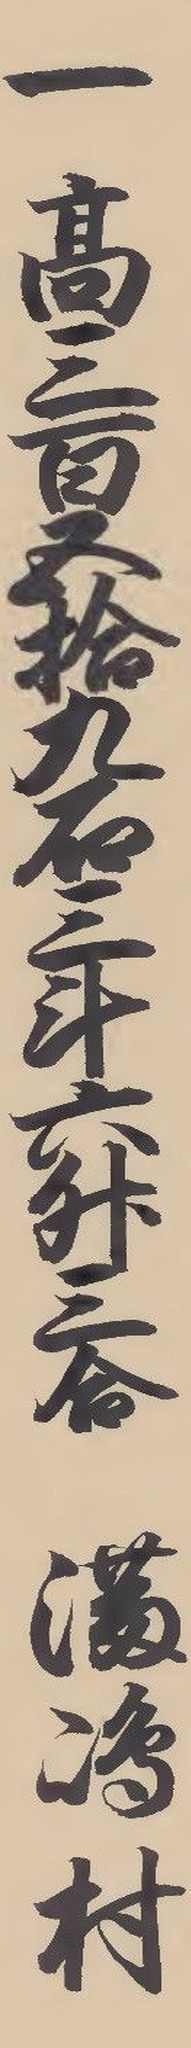一高三百五拾九石三斗六升三合満島村
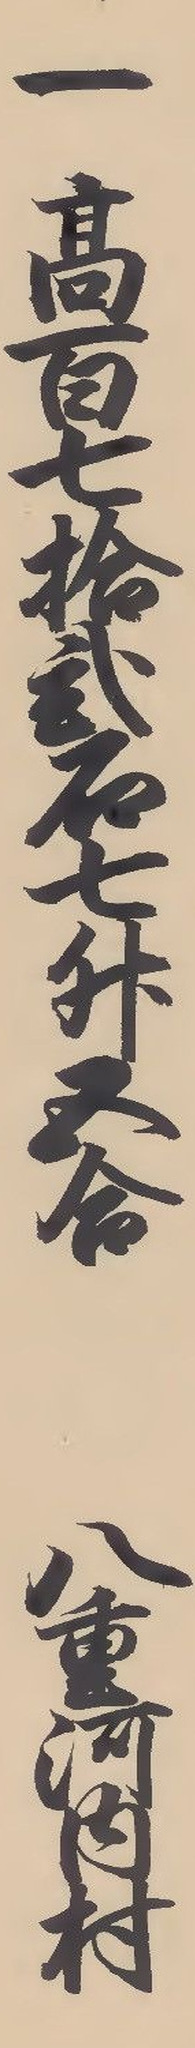一高百七拾弐石七升五合八重河内村
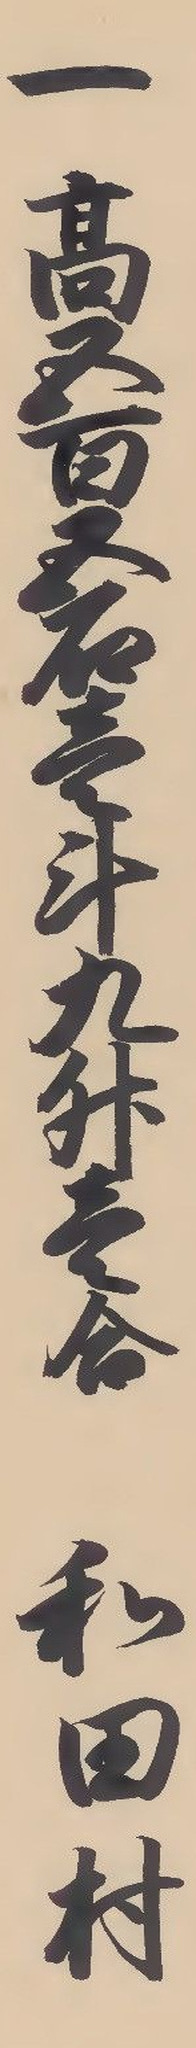一高五百五石壱斗九升壱合和田村

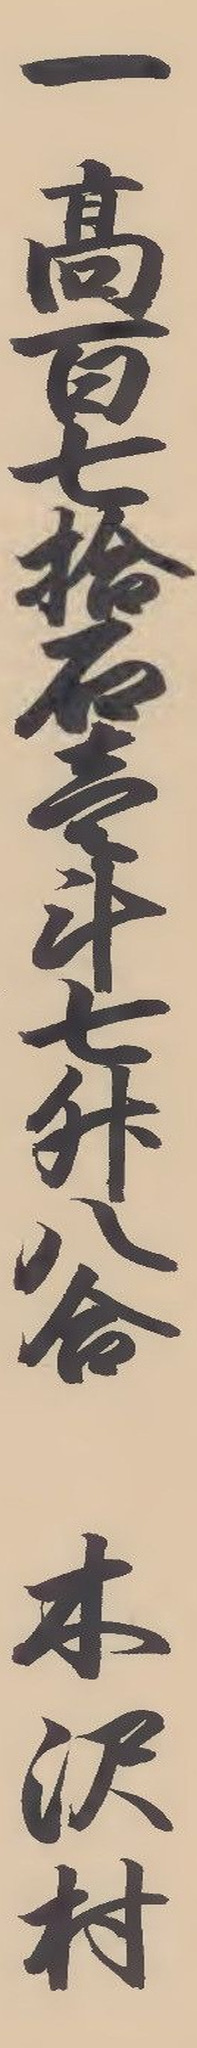一高百七拾石壱斗七升八合木沢村
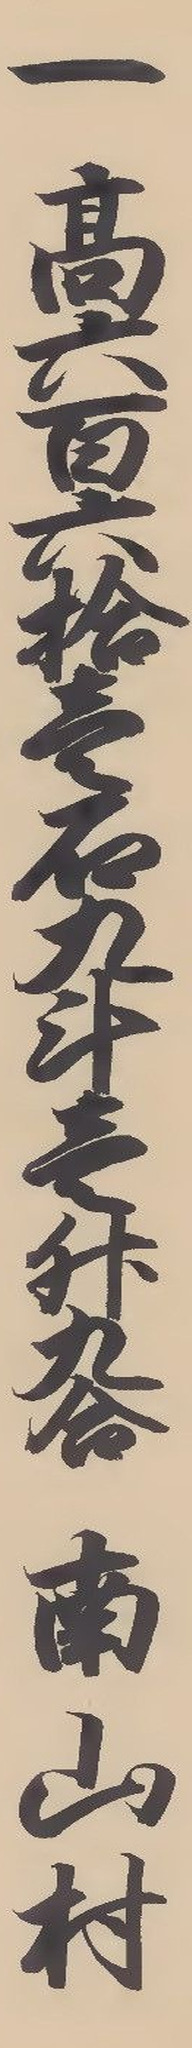一高六百六拾壱石九斗壱升九合南山村
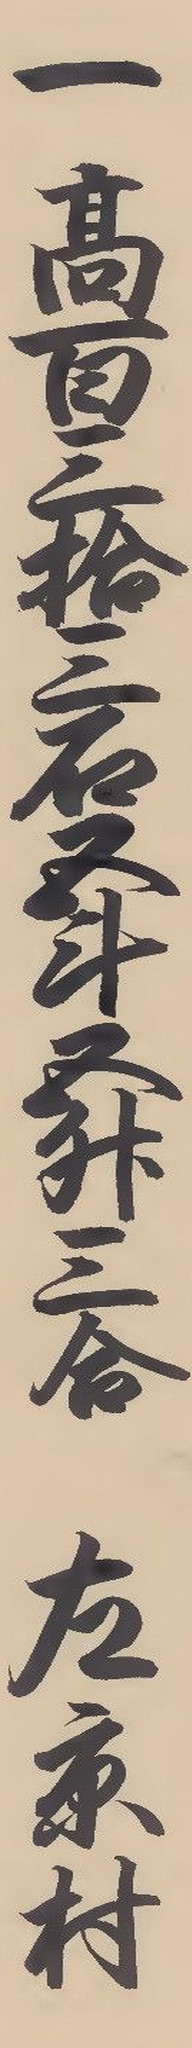一高百三拾三石五斗五升三合左京村
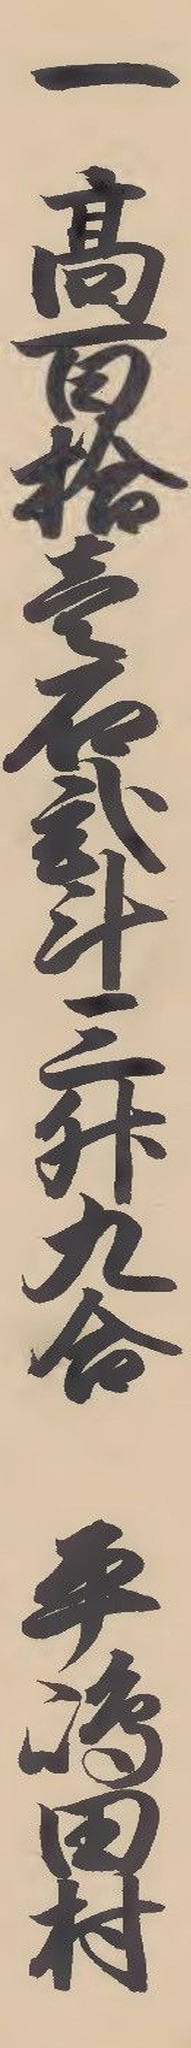一高百拾壱石弐斗三升九合平島田村
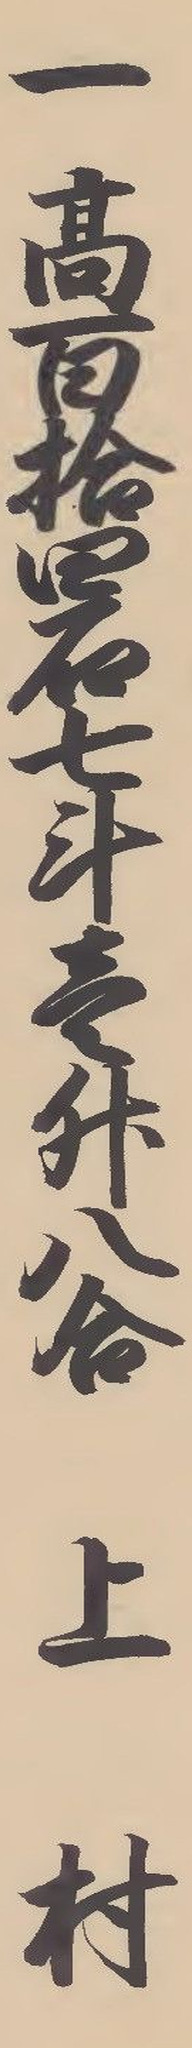一高百拾四石七斗壱升八合上村
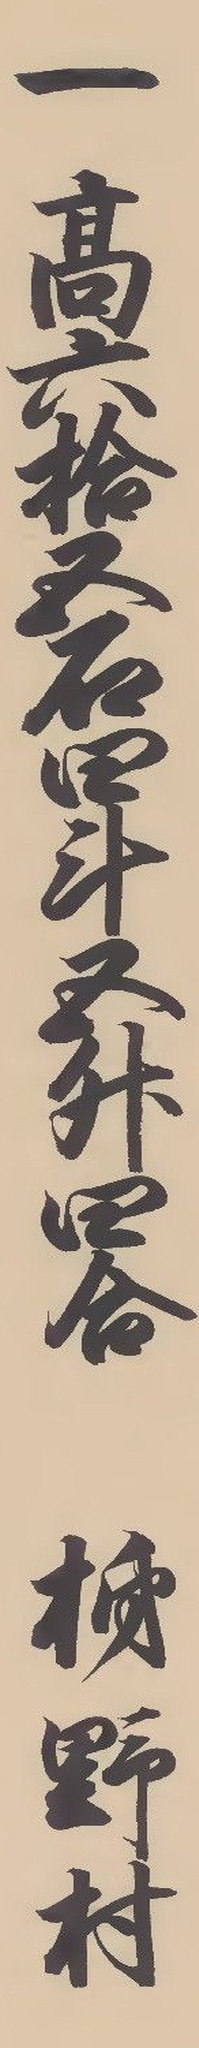一高六拾五石四斗五升四合柿野村
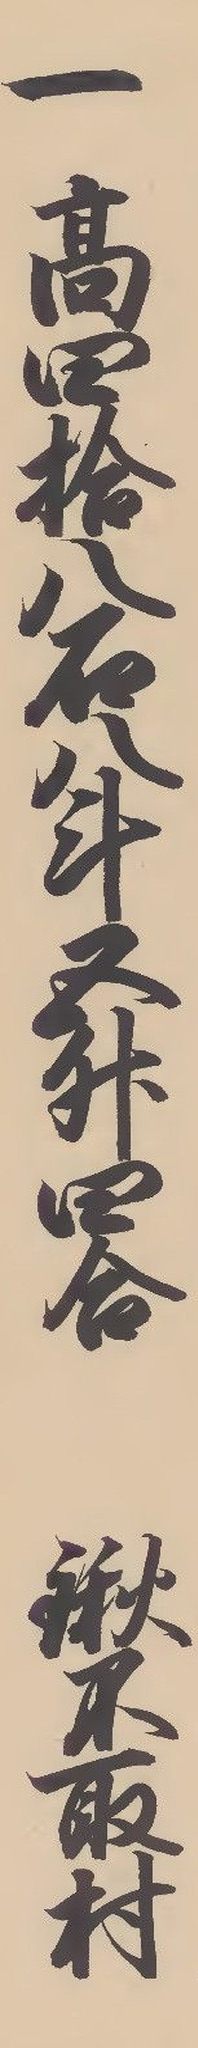一高四拾八石八斗五升四合鍬不取村

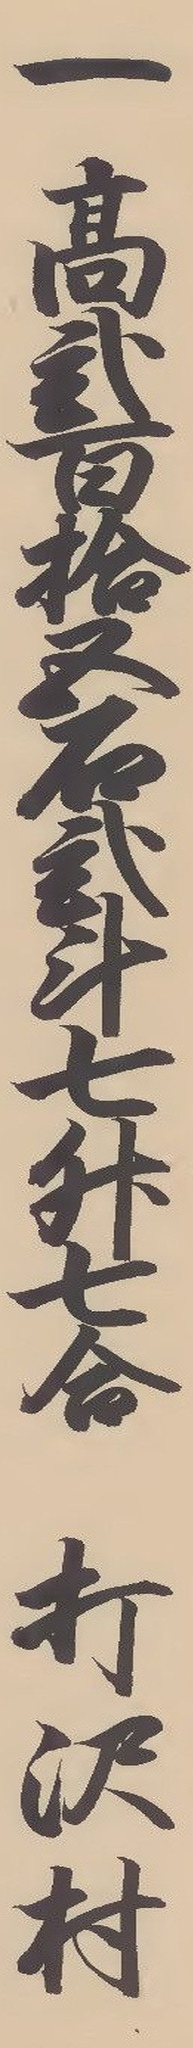一高弐百拾五石弐斗七升七合打沢村
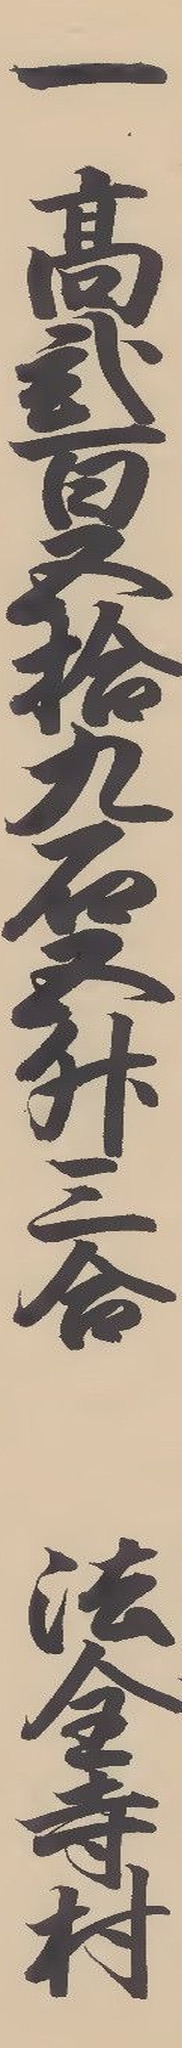一高弐百五拾九石五升三合法全寺村
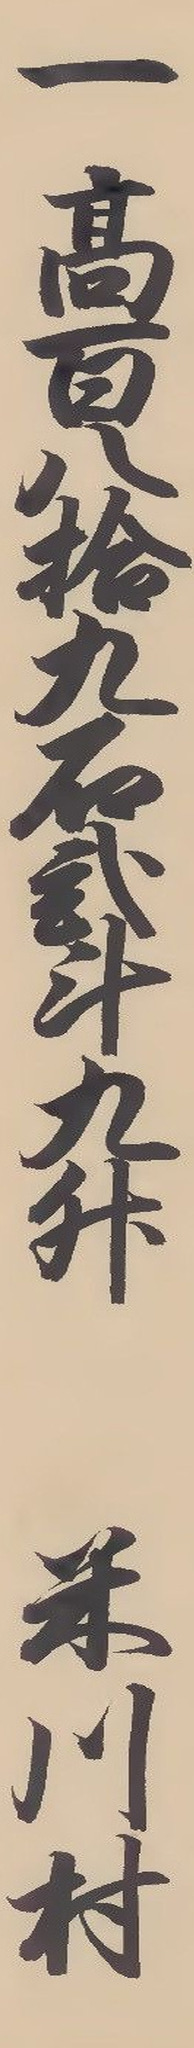一高百八拾九石弐斗九升米川村
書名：信濃国郷帳
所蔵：国立公文書館 National Archives of Japan
